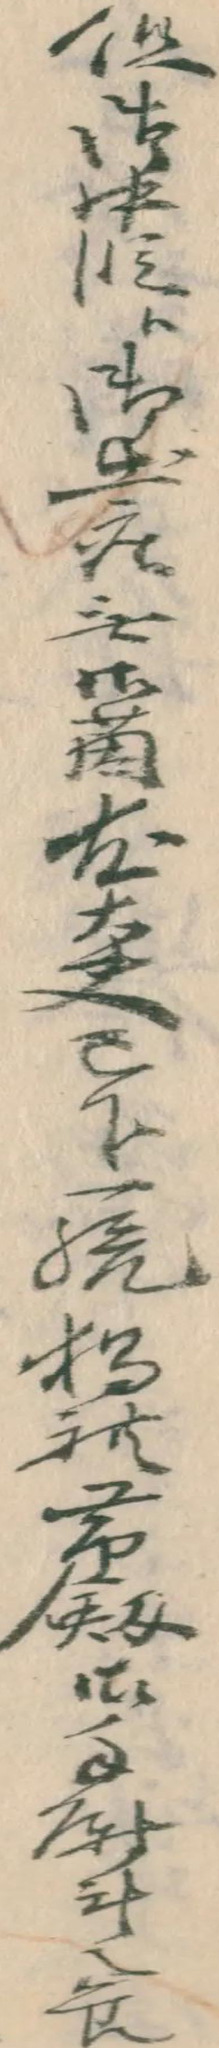但御中段え御出座無御茵尤大夫已下一統褐礼帯劔御手熨斗之節
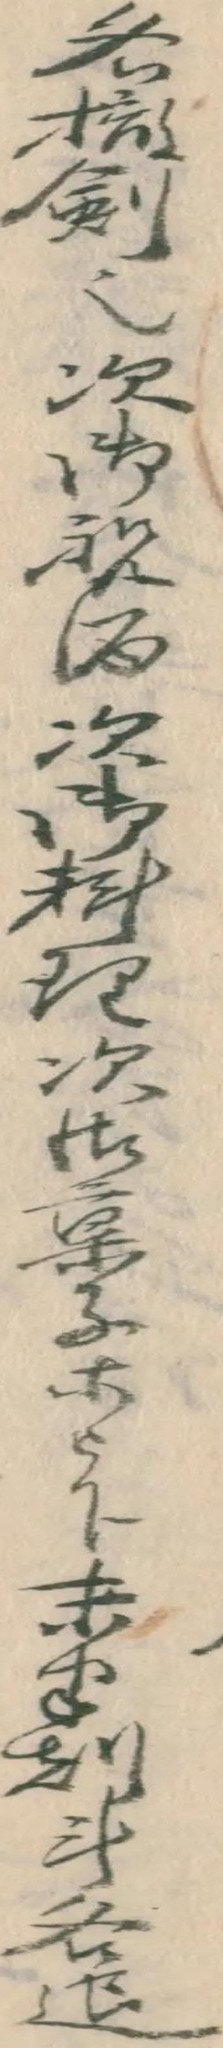各撒剣也次御祝酒次御料理次御菓子等被下未半刻斗各退
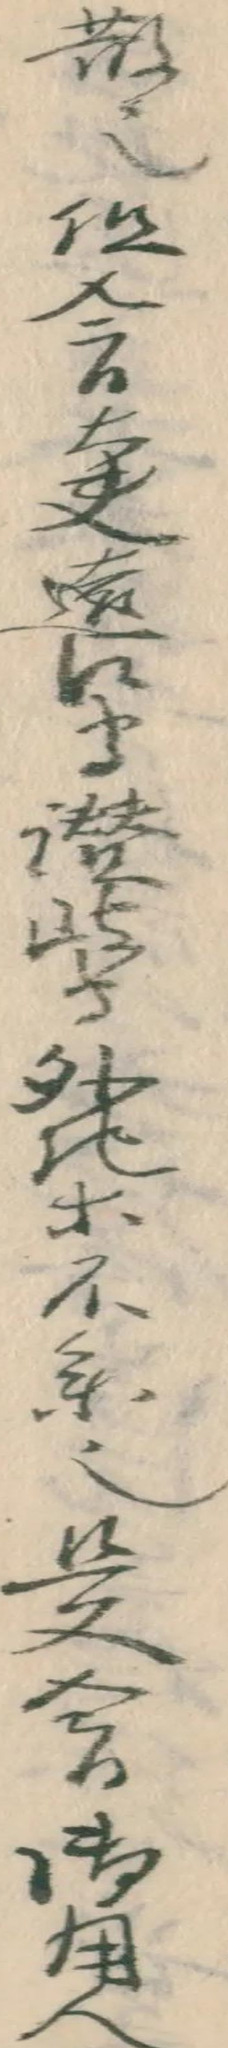散也但今日大夫遠江守讃岐守外記等不参也且又今日御用人
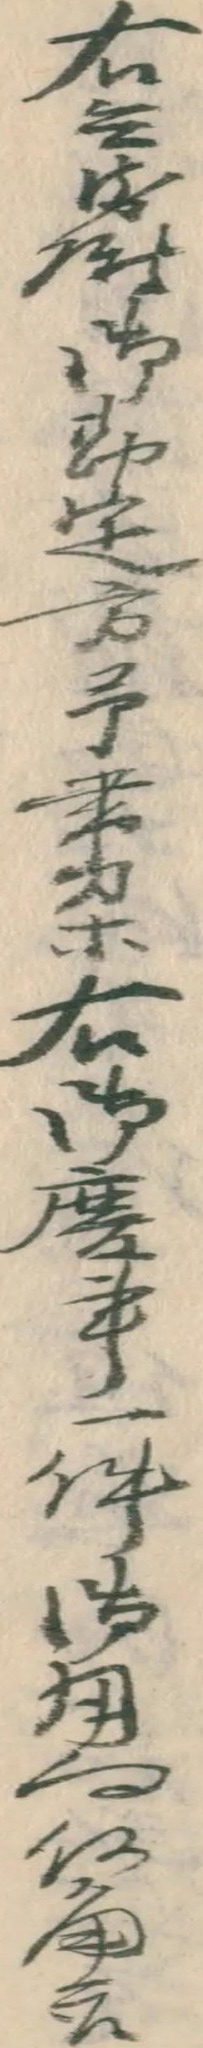右兵衛尉御勘定方予帯刀等右御慶事一件御用向何角取
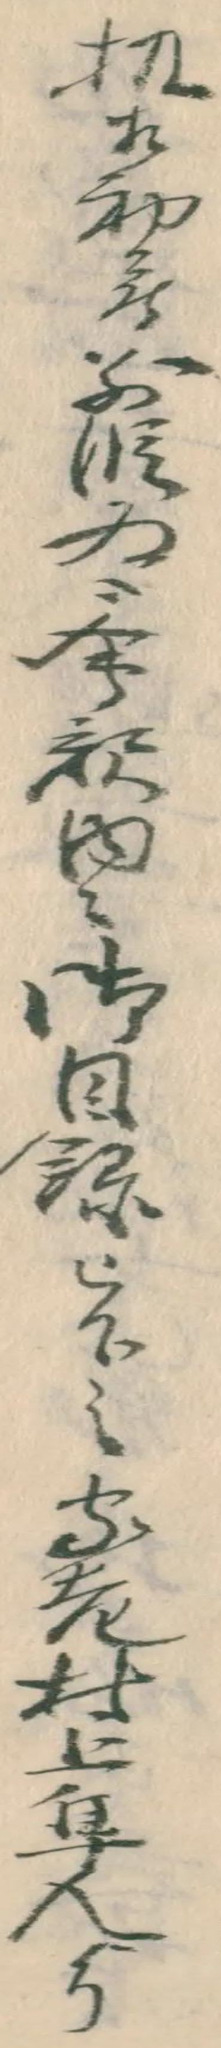様相勤ニ付別段為ニ會釈内々御目録被下之家老村上隼人より
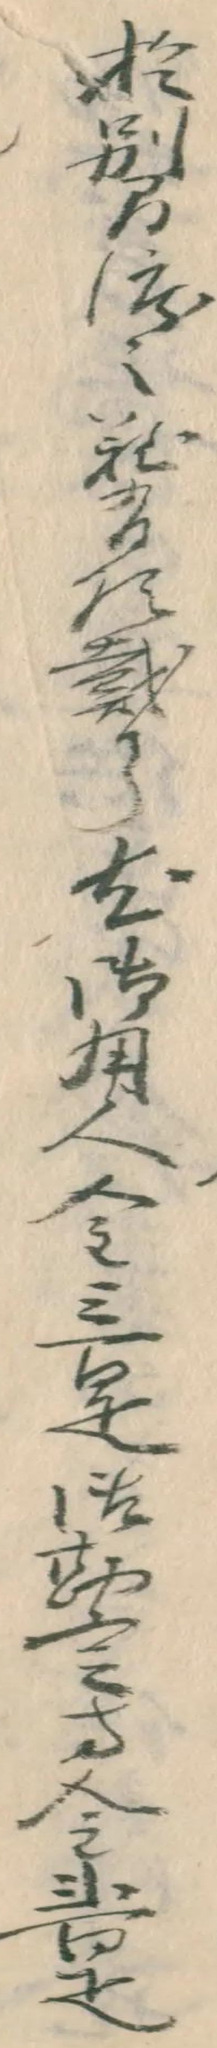於別間渡之難有頂戴了尤御用人金三百疋御勘定方金弐百疋
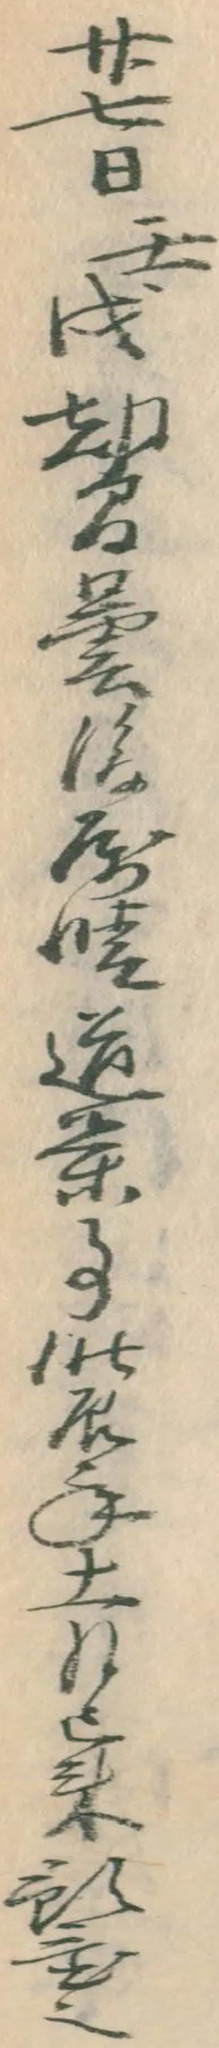廿七日壬戌刻間曇後属晴道栄事昨辰年十一月已来預置也

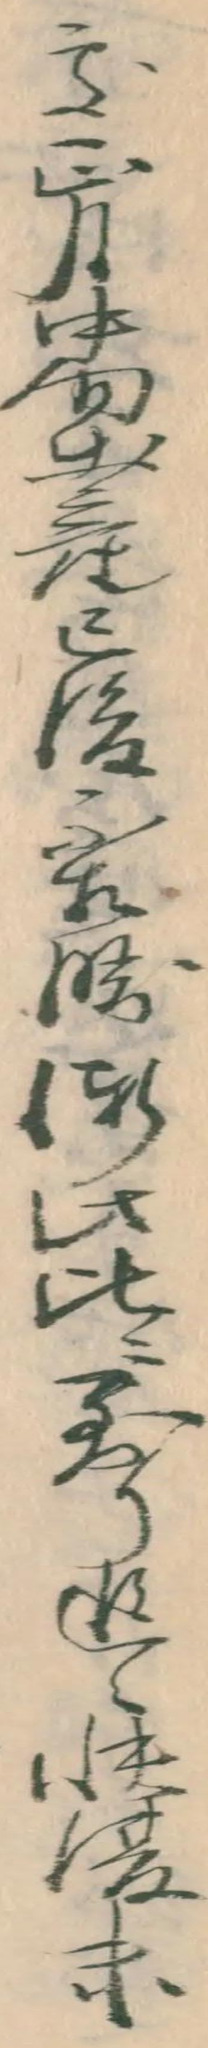處正月中旬出産已後不相勝漸此比ニ到り追々快復未
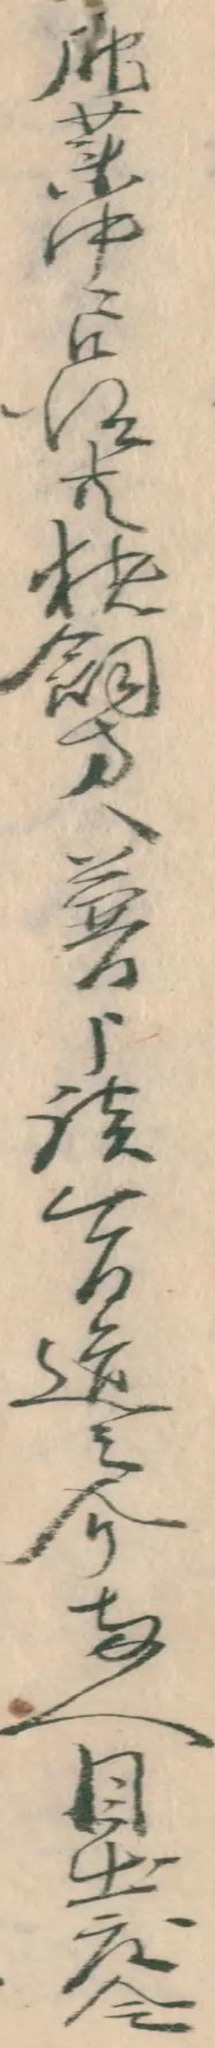服用中に候得共猪飼方へ兼而申談今日道之介両人目出度令
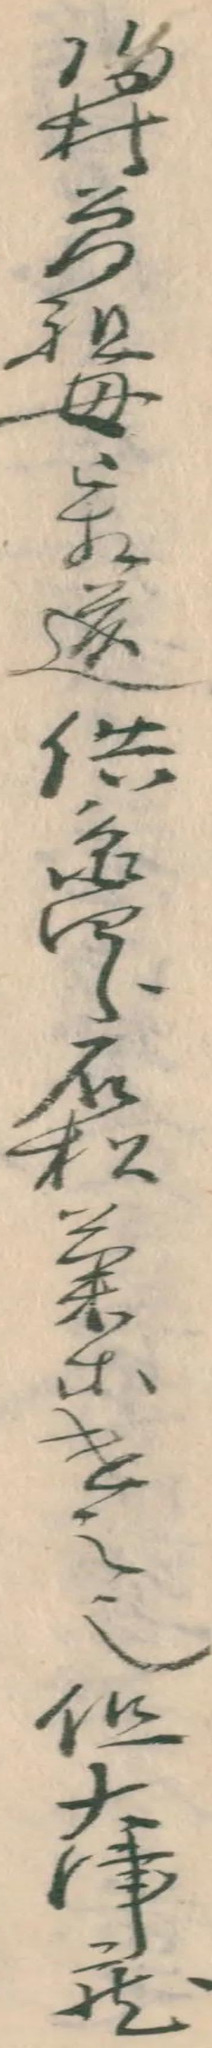帰村曽祖母被相送供亀四郎石松菊等遣之也但大津蔵
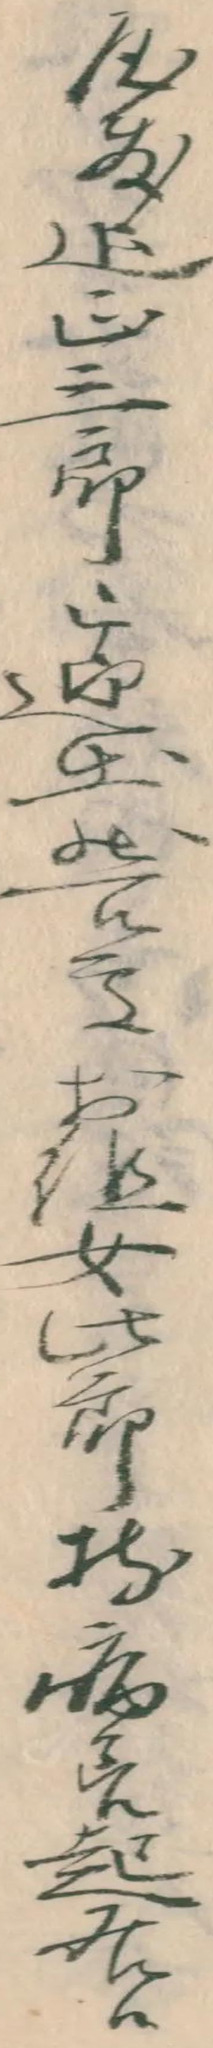屋敷迄正三郎被迎出の處お組女此節持病差起居候
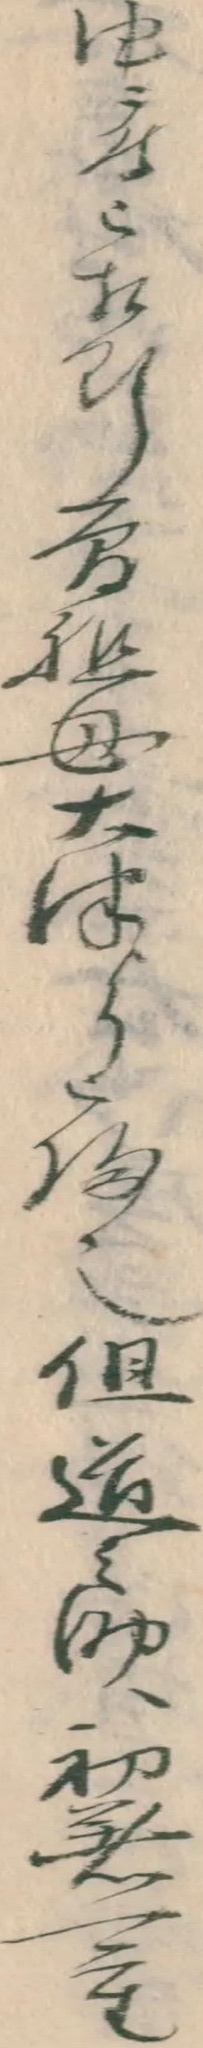由ニ付被相断曽祖母大津より被帰也但道之助ハ初者一重
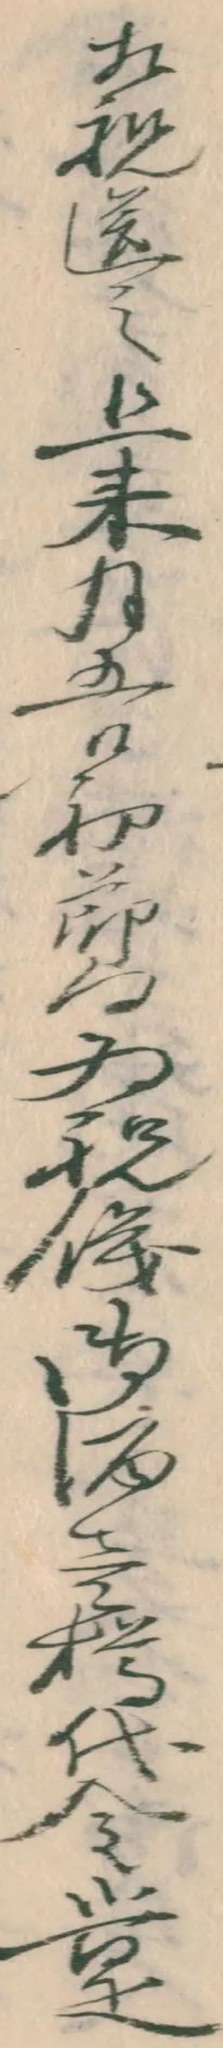相祝送之上来月五日初節句祝儀御酒壱樽代金弐百疋
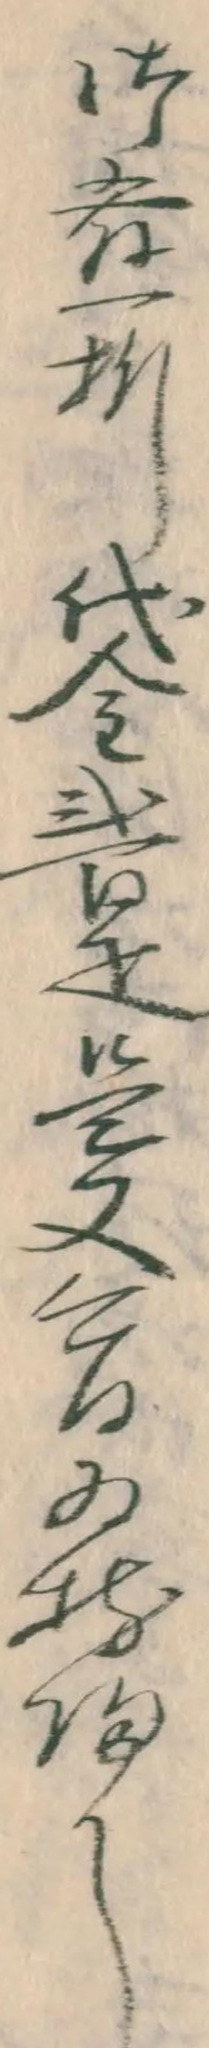御肴一折代金弐百疋是又今日為持帰了
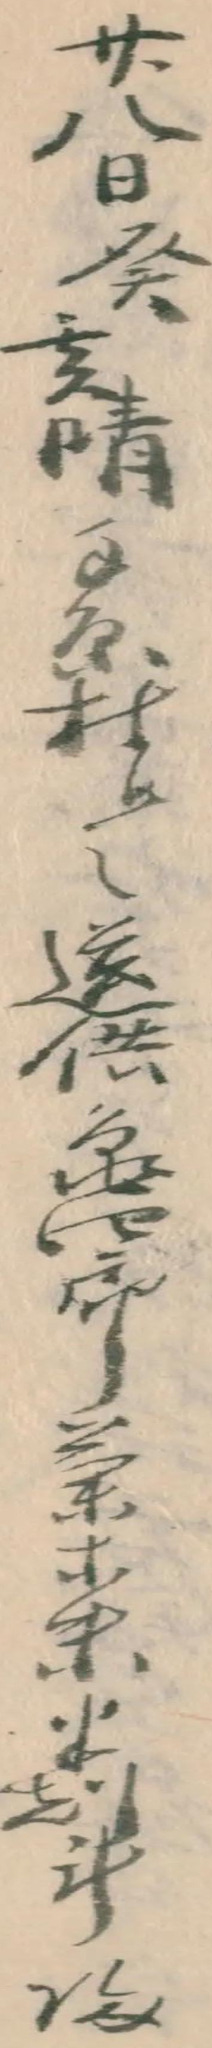廿八日癸亥晴手原村え之送供亀四郎菊等末半刻斗帰
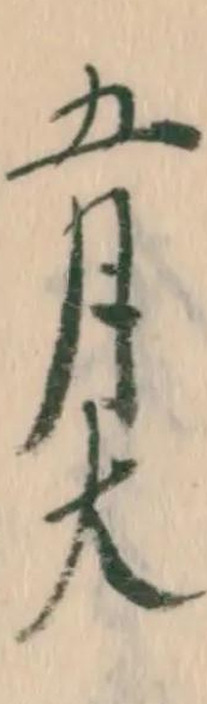五月大
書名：賀茂社記録. 第66冊
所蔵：国立国会図書館 National Diet Library, JAPAN
